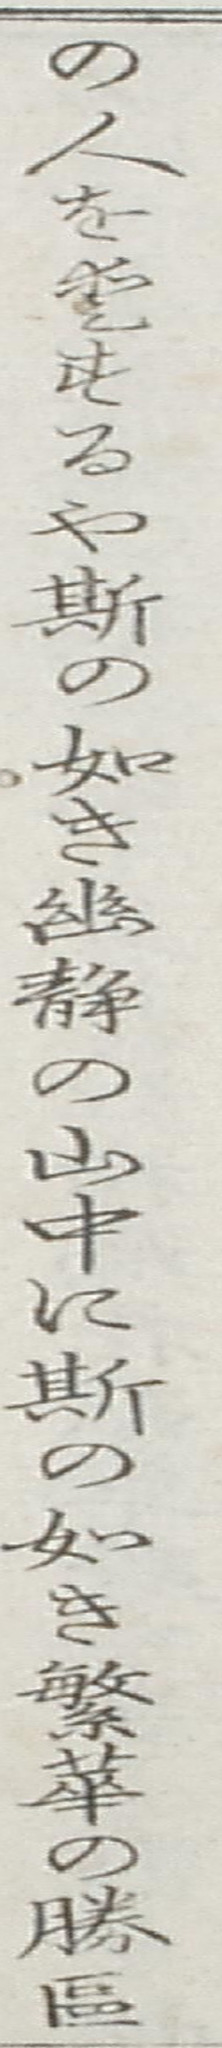の人を益するや斯の如き幽静の山中に斯の如き繁華の勝区
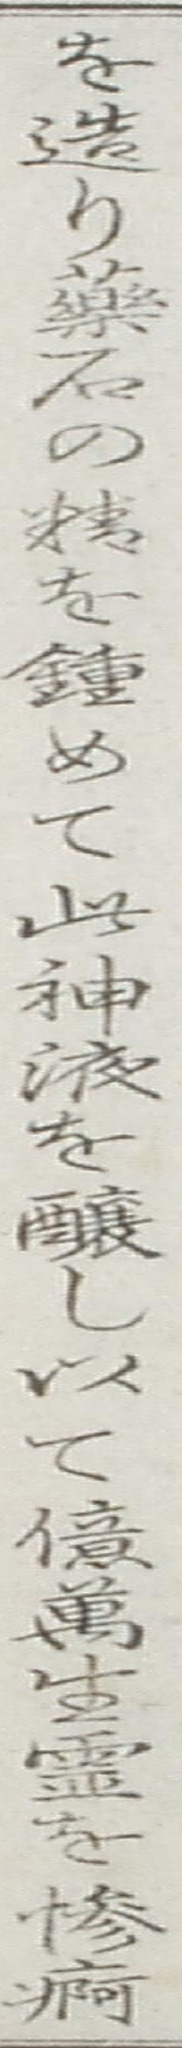を造り薬石の精を鍾めて此神液を醸し以て億萬生霊を惨痾
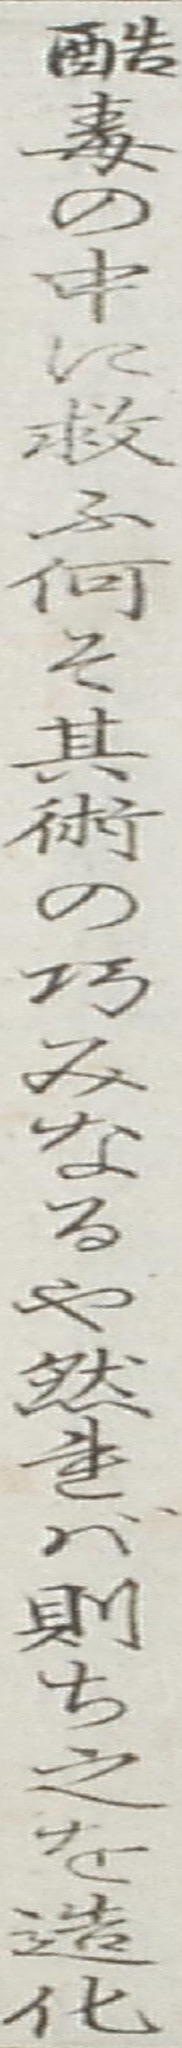酷毒の中に救ふ何そ其術の巧みなるや然れば則ち之を造化
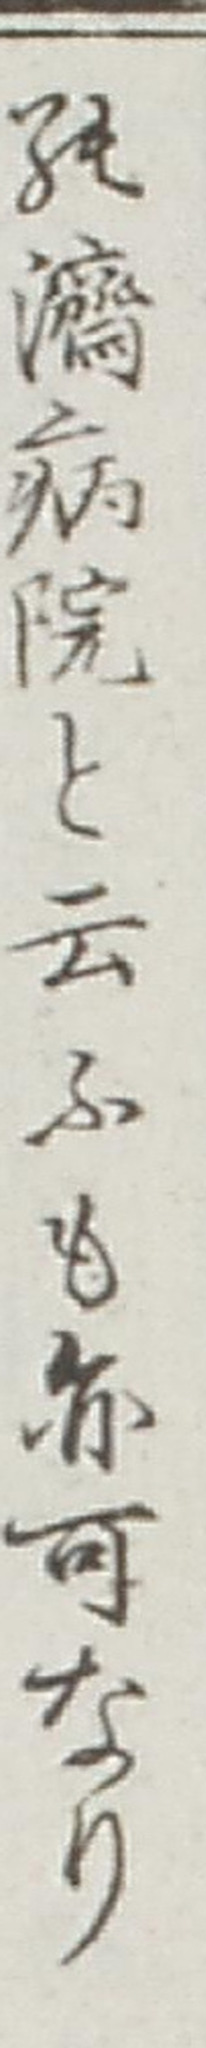にも濟病院と云ふも亦可なり
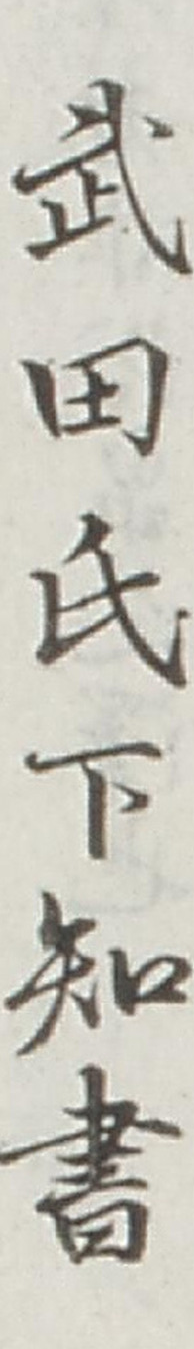武田氏下知書
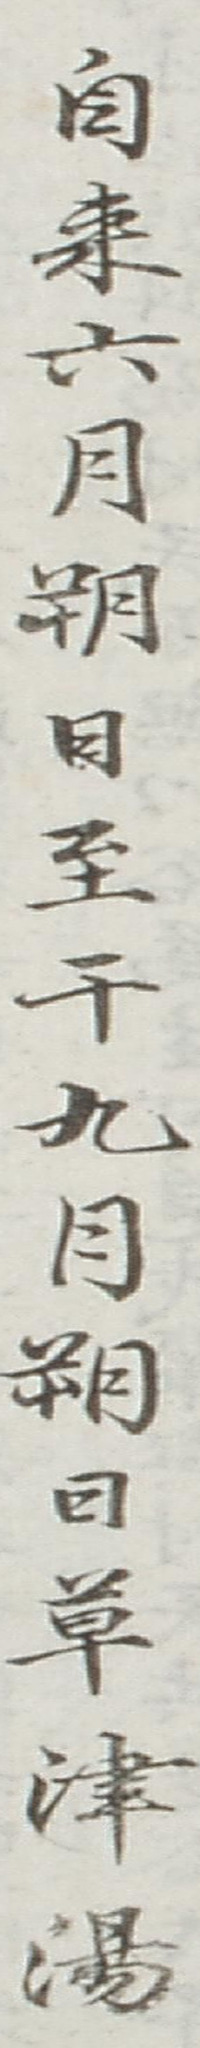自来六月朔日至干九月朔日草津湯
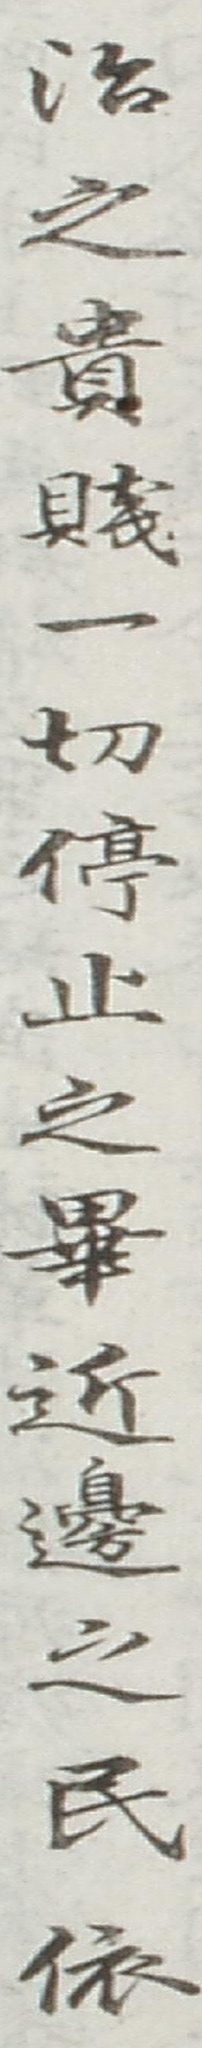治之貴賤一切停止之畢近邊之民依
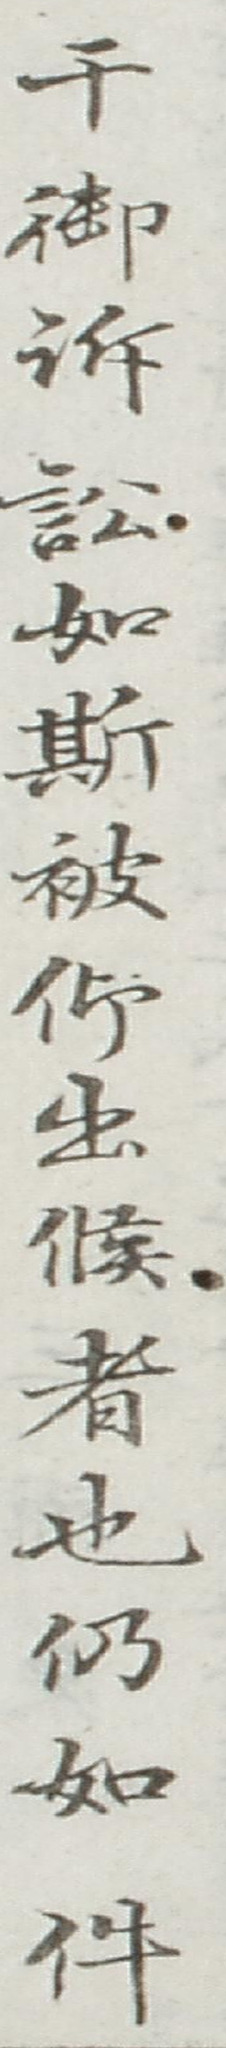干御訴訟如斯被御出候者也仍如件
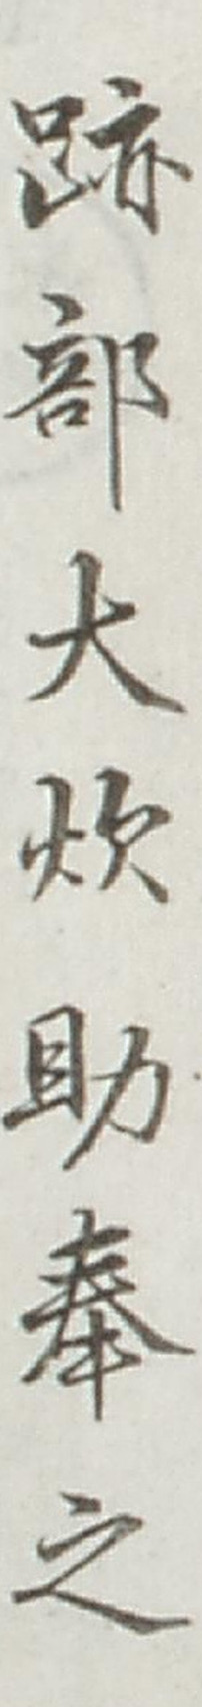跡部大炊助奉之

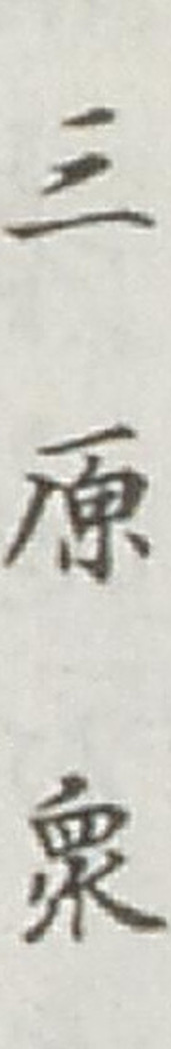三原衆
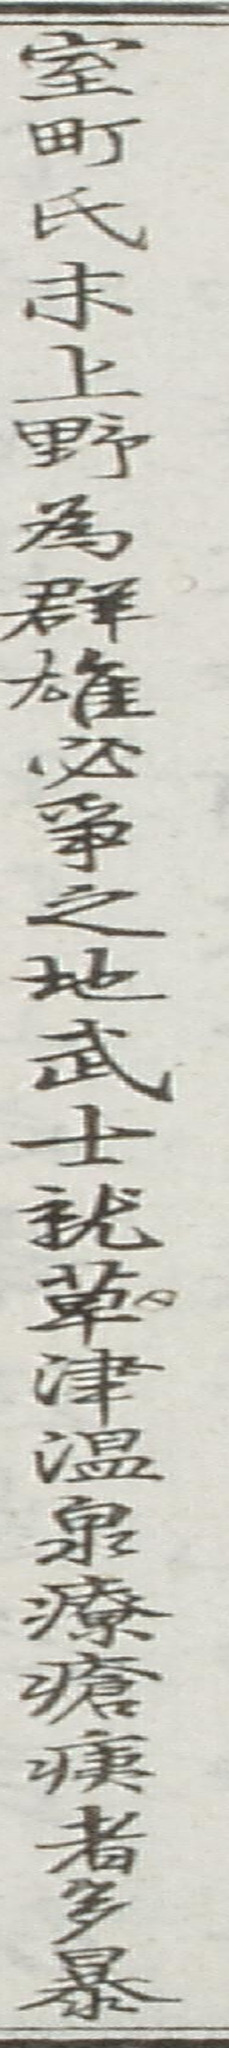室町氏末上野為群雄必争之地武士就草津温泉療瘡痍者多暴
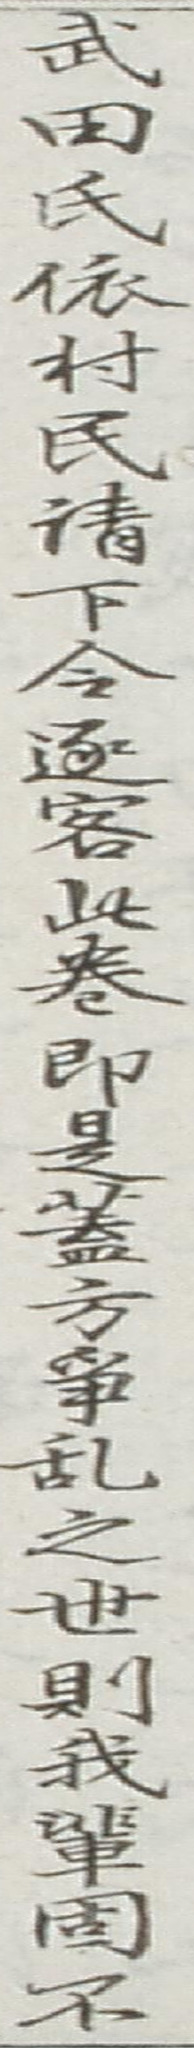武田氏依村民情下令逐客此巻即是蓋方争乱之世則我輩固不
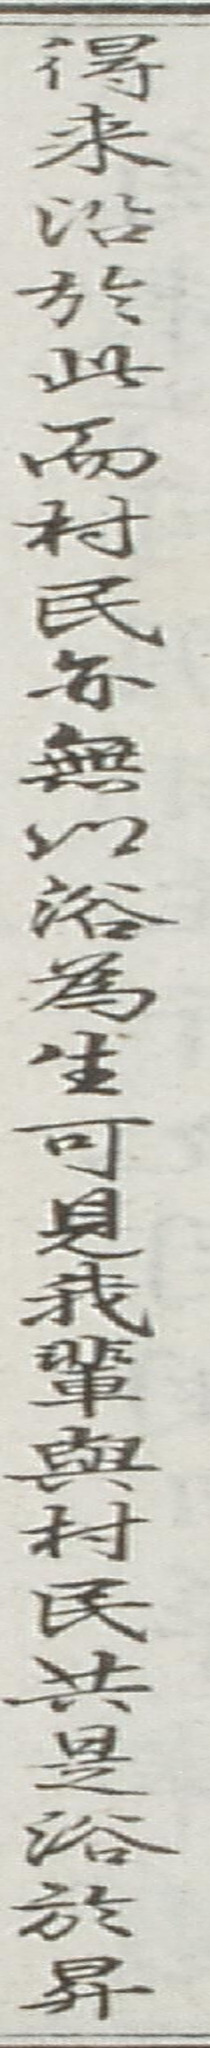得来沿於此而村民亦無以浴為生可見我輩與村共是浴於昇
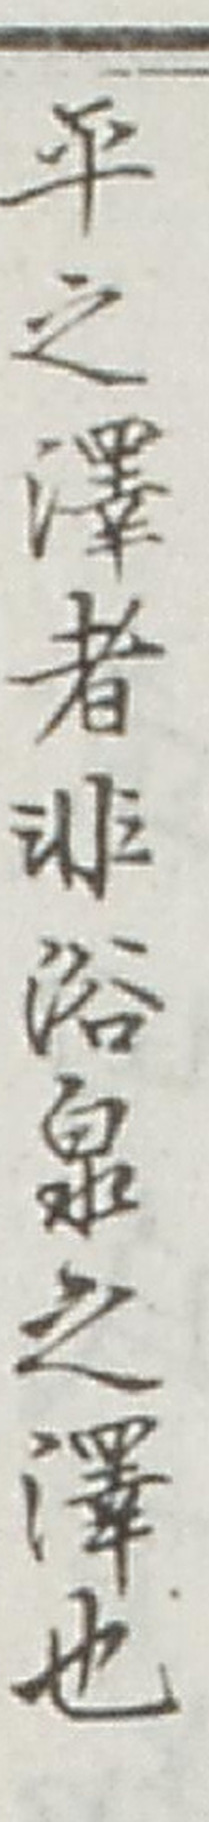平之澤者非浴泉之澤也
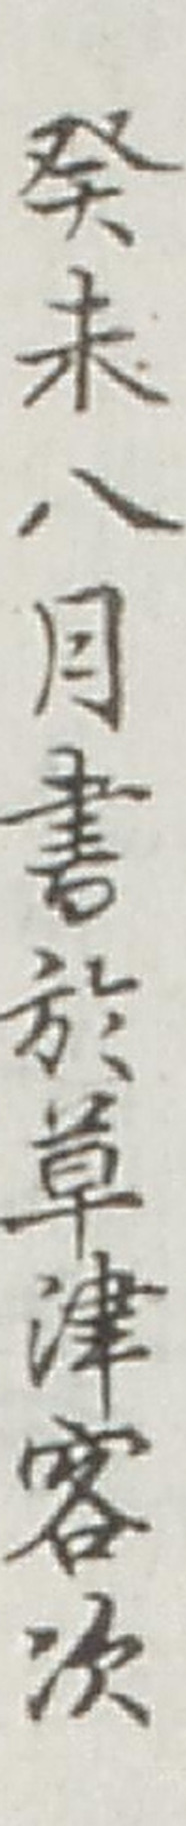癸未八月書於草津客次
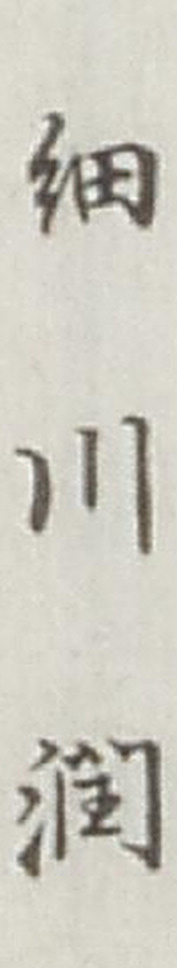細川潤
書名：草津温泉誌　全
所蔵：東京大学地震研究所図書室 Earthquake Research Institute Library, The University of Tokyo, JAPAN
